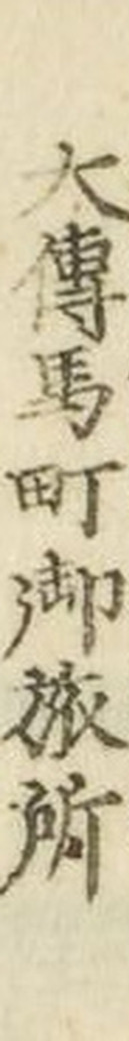大伝馬町御旅所
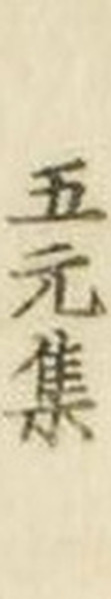五元集
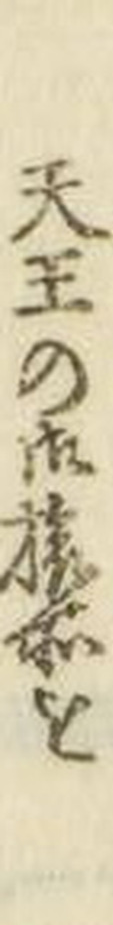天王の御旅所と
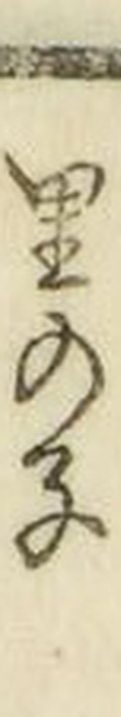里の子
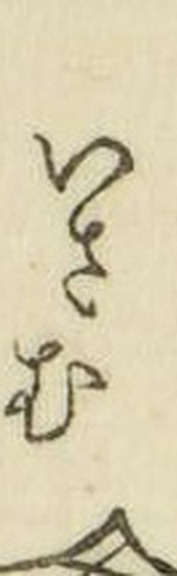いさむ

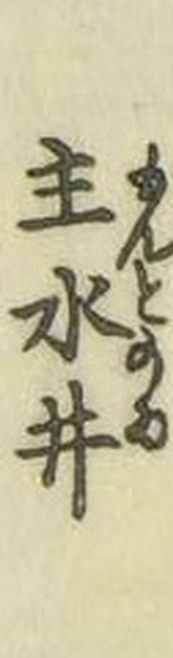主水井
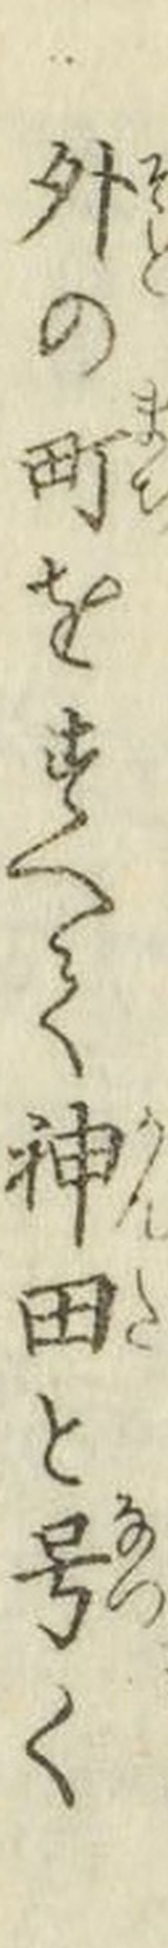外の町をすへて神田と号く
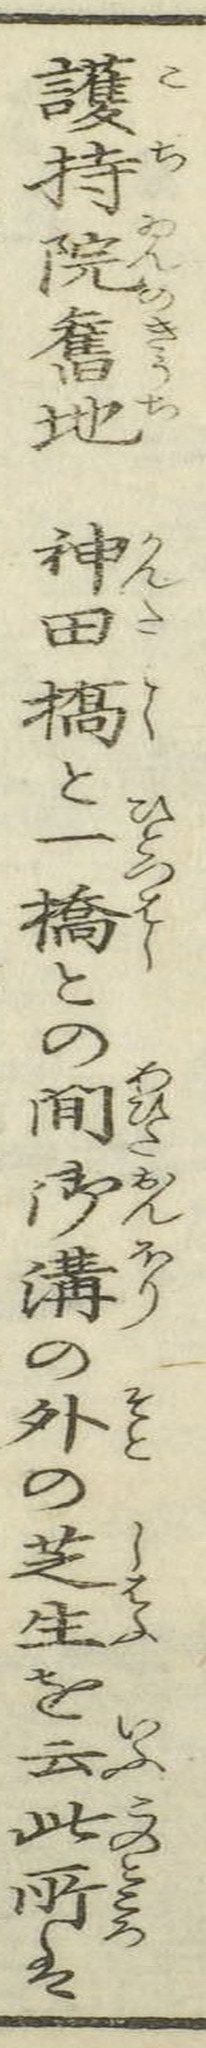護持院旧地神田橋と一橋との間御溝の外の芝生を云此所は
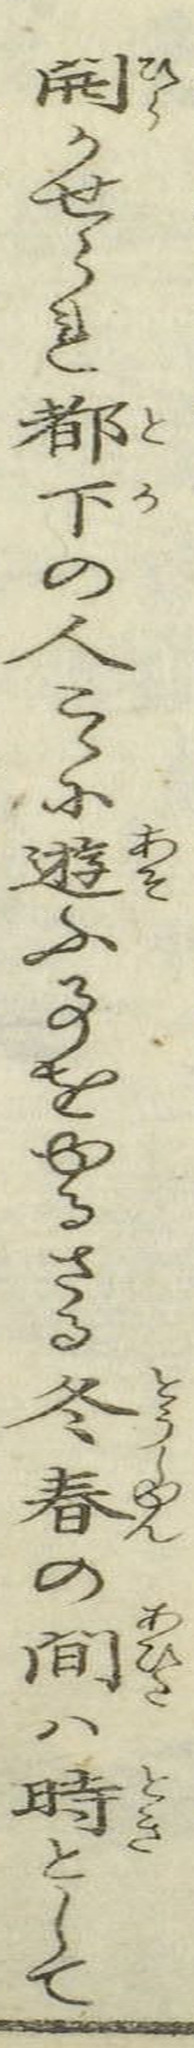開かせられ都下の人こゝに遊ふ事をゆるさる冬春の間は時として
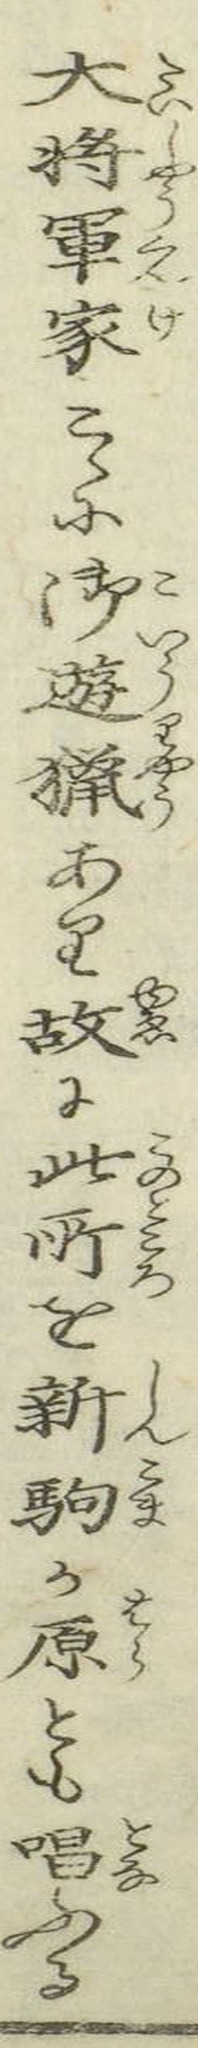大将軍家こゝに御遊猟あり故に此所を新駒か原とも唱ふる
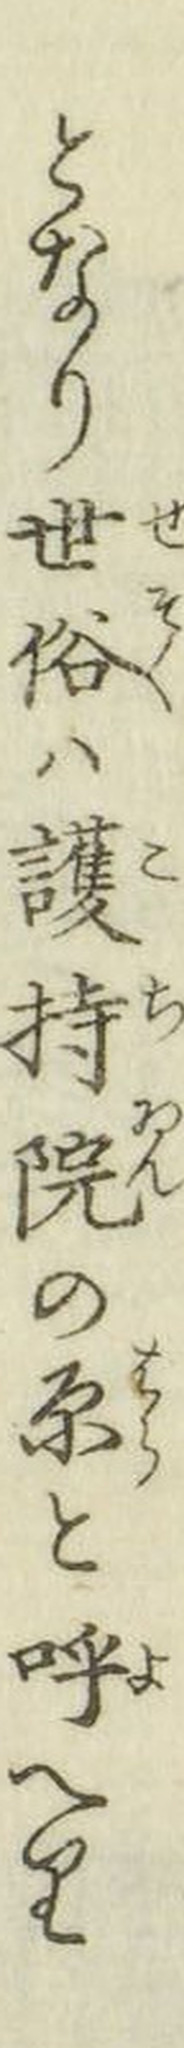となり世俗は護持院の原と呼へり
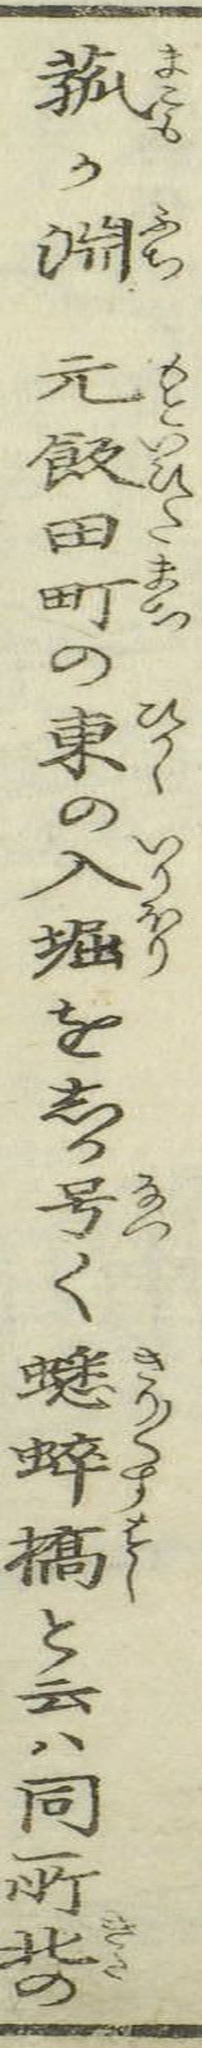菰か淵元飯田町の東の入堀をしか号く蟋蟀橋と云は同所北の
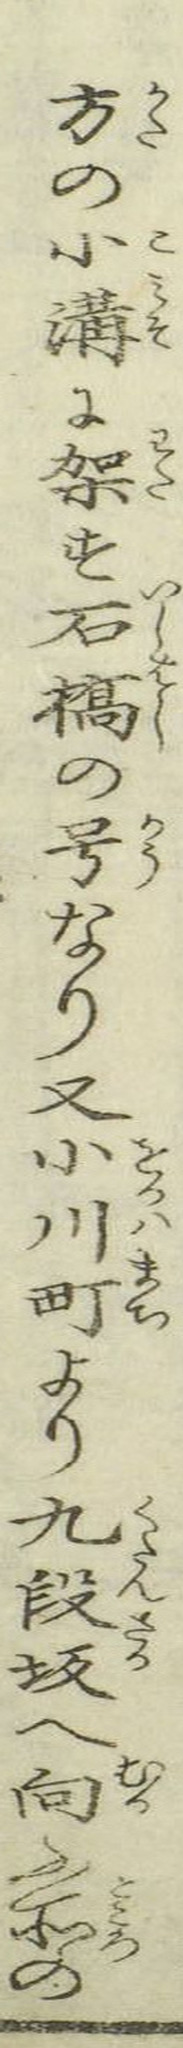方の小溝に架す石橋の号なり又小川町より九段坂へ向ふ所の

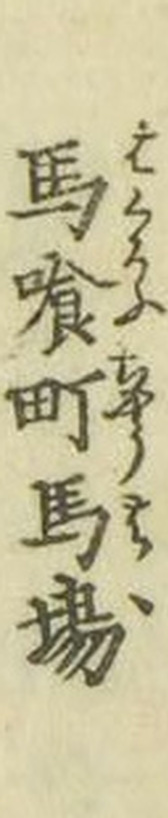馬喰町馬場
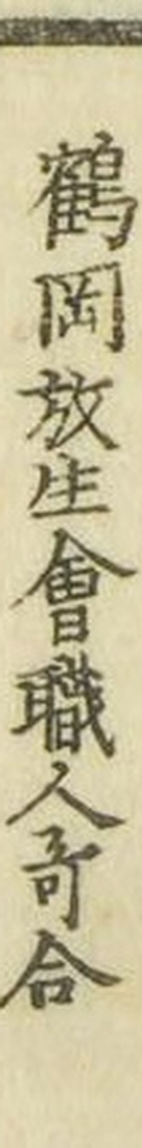鶴岡放生会職人歌合
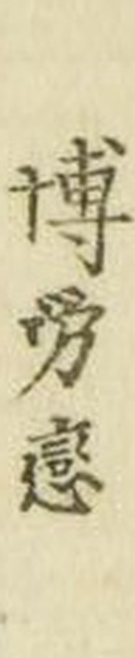博労恋
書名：江戸名所図会 20巻 巻之1
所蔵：東京学芸大学教育コンテンツアーカイブ
